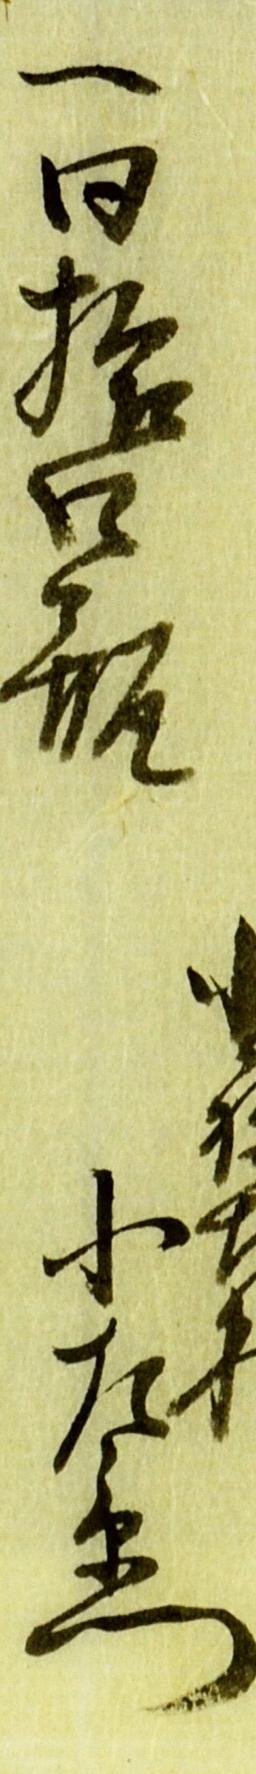一同拾四瓶小左衛門
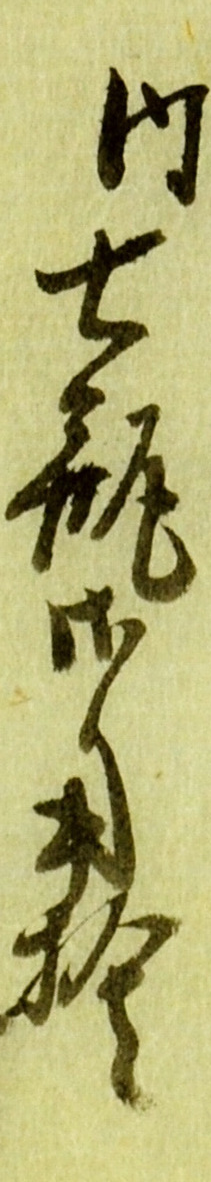内七瓶御用捨
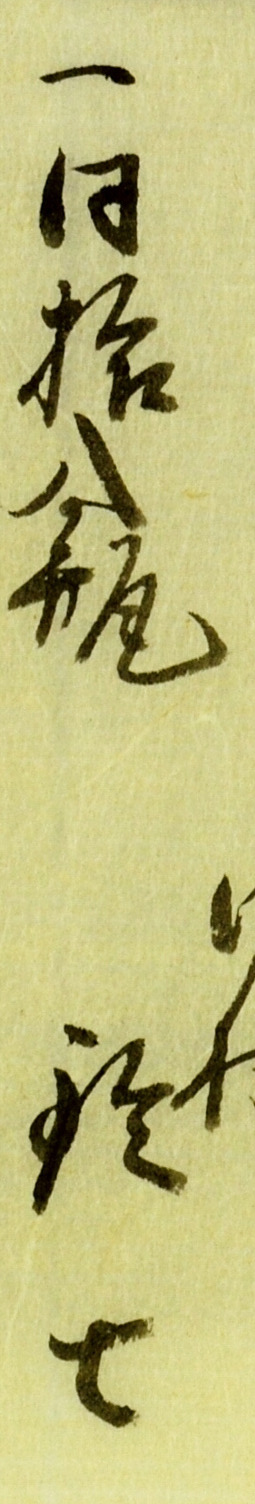一同拾八瓶鈴七
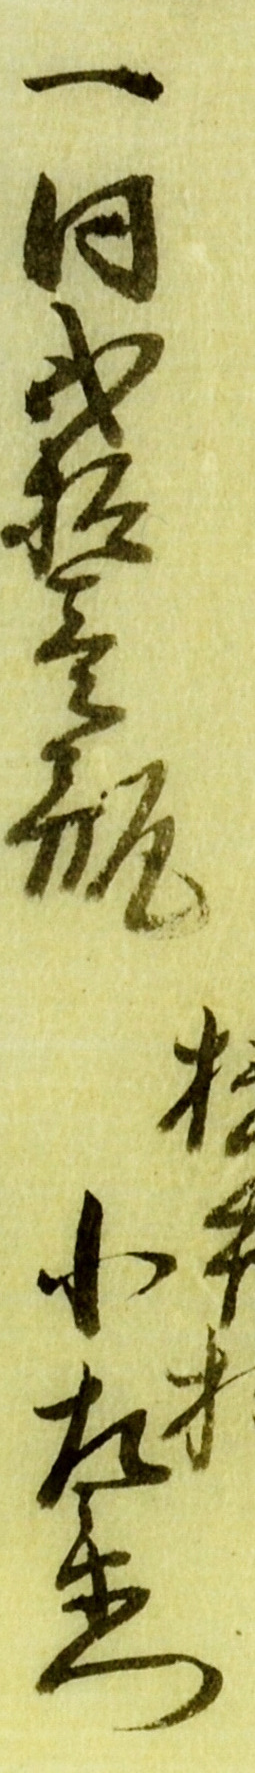一同弐拾壱瓶小左衛門
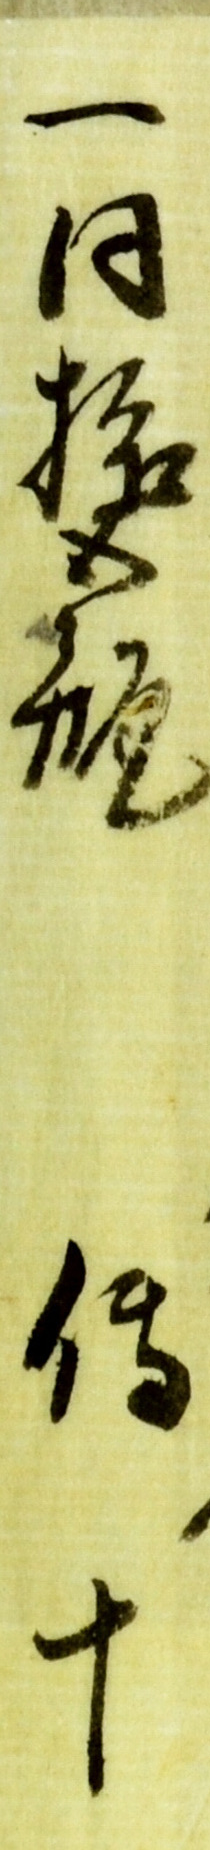一同拾五瓶伝十

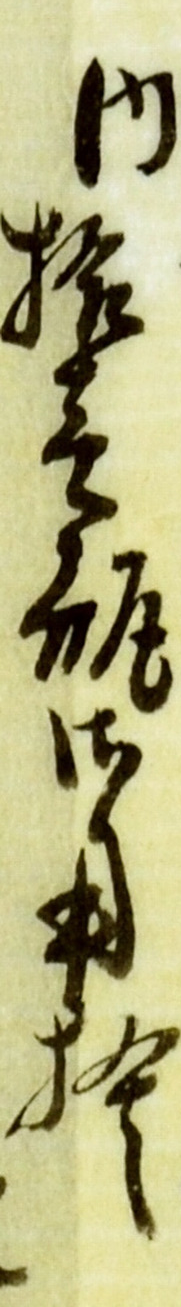内拾壱瓶御用捨
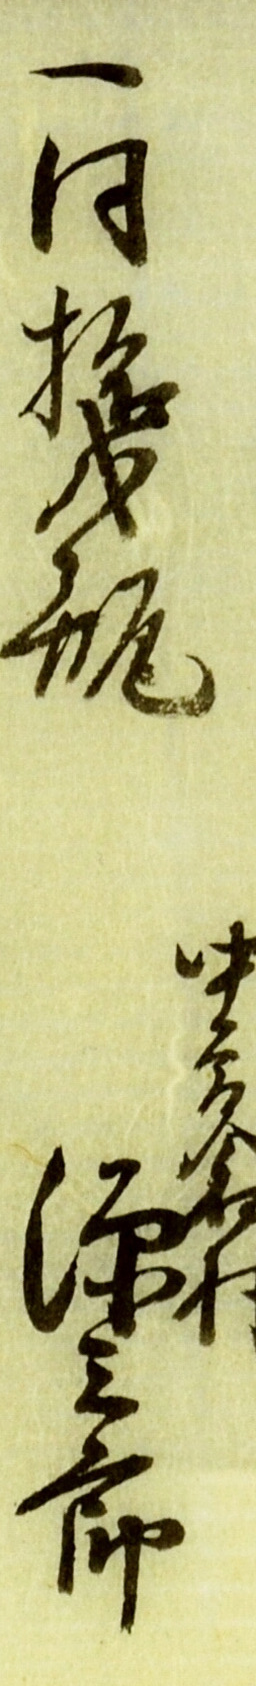一同拾弐瓶源三郎
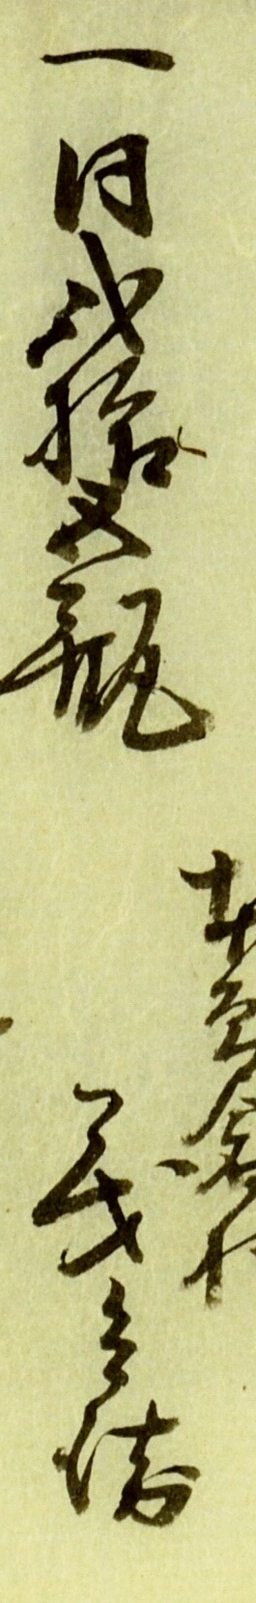一同弐拾五瓶義兵衛
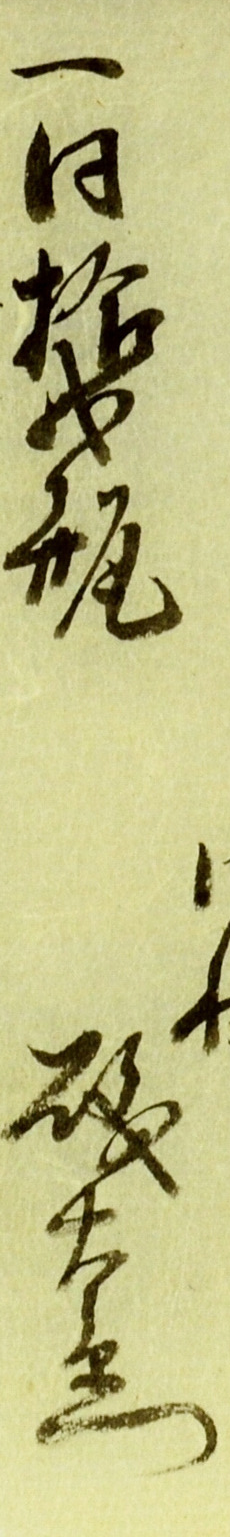一同拾弐瓶磯右衛門
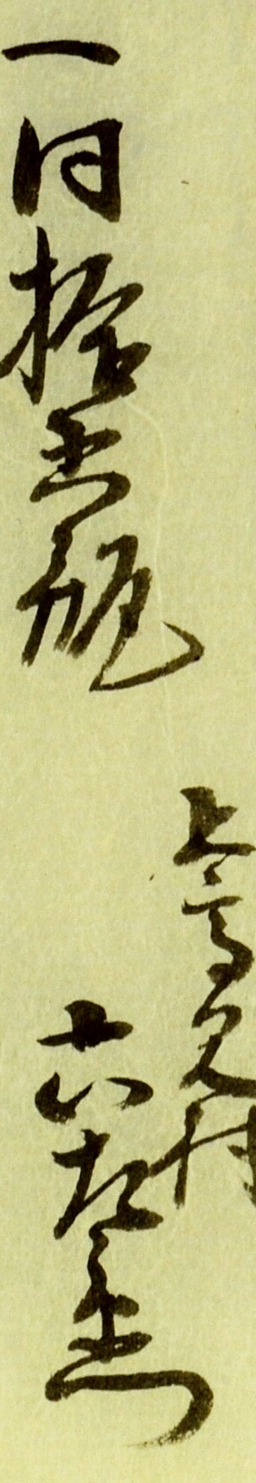一同拾六瓶六左衛門
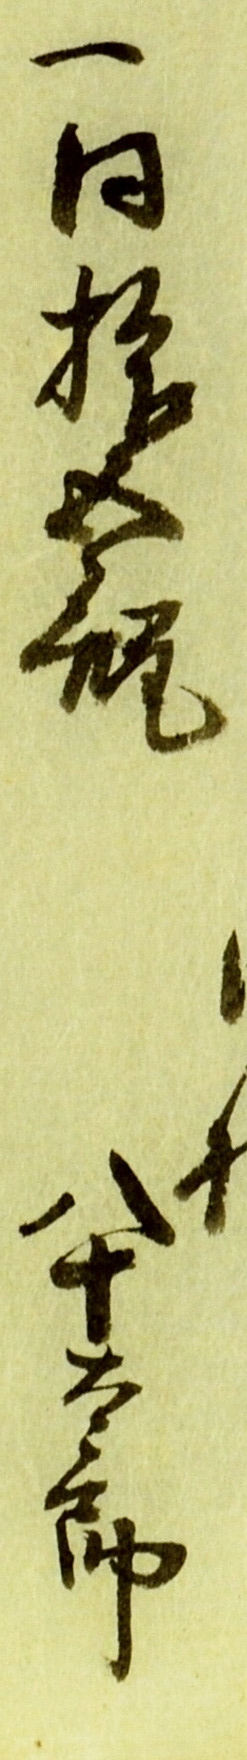一同拾五瓶八十太郎
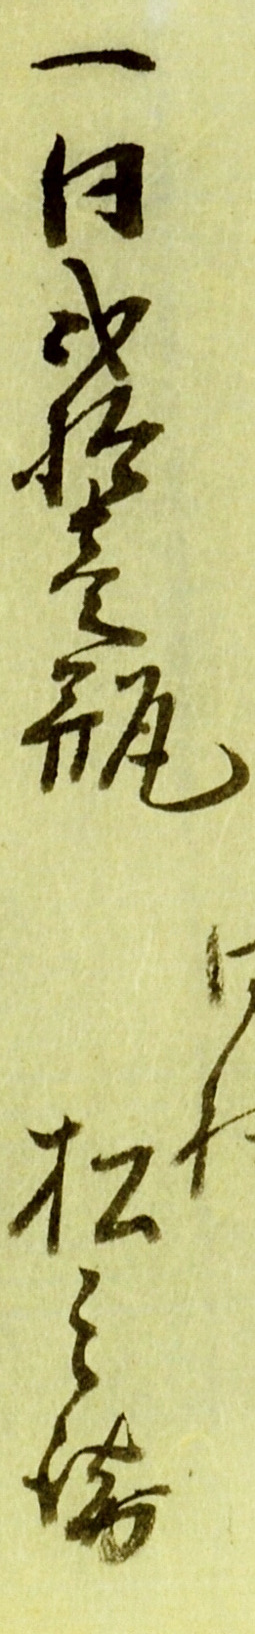一同弐拾壱瓶松兵衛
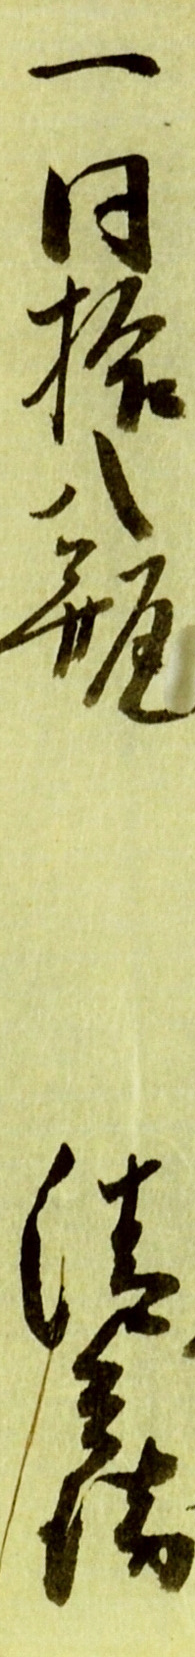一同拾八瓶清兵衛
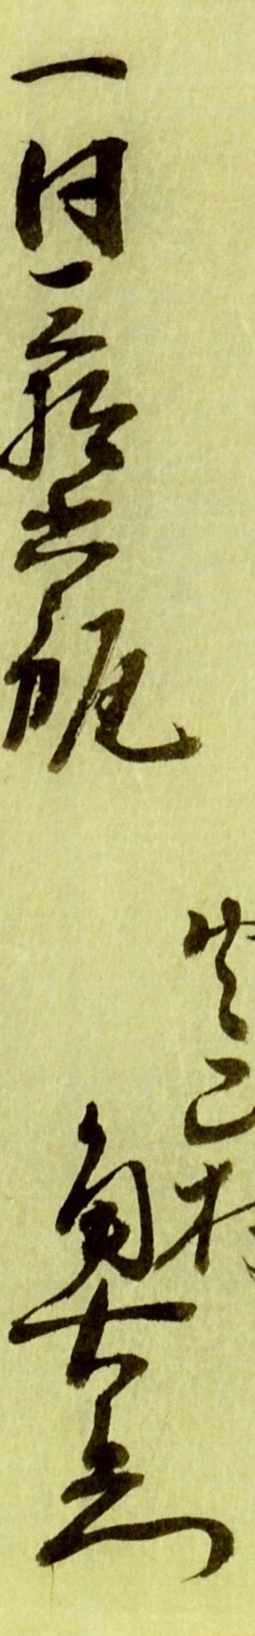一同三拾六瓶角右衛門
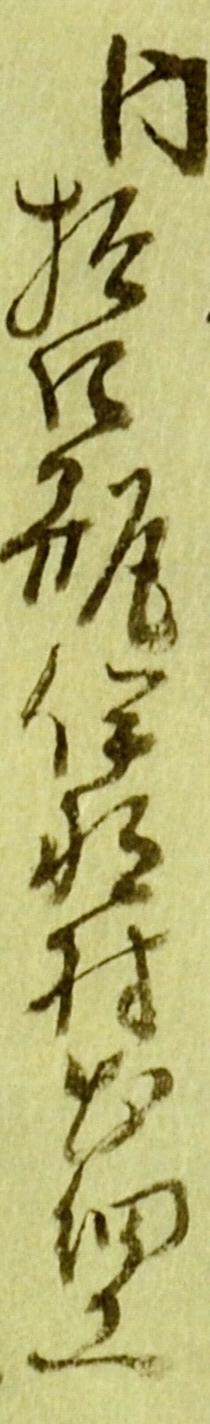内拾四瓶伊那村出細工
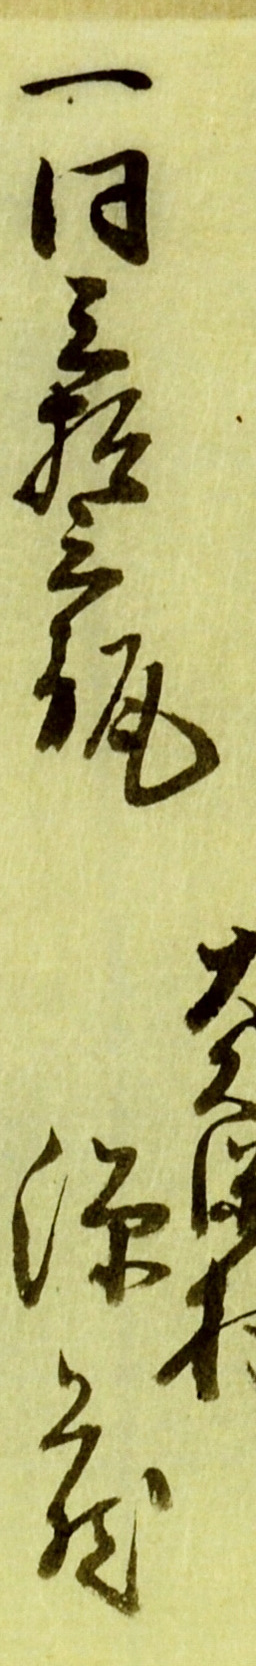一同三拾三瓶源蔵
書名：御領分中御領分中紺屋藍瓶員数御改帳
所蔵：伊那市立高遠町図書館・合同会社AMANE
